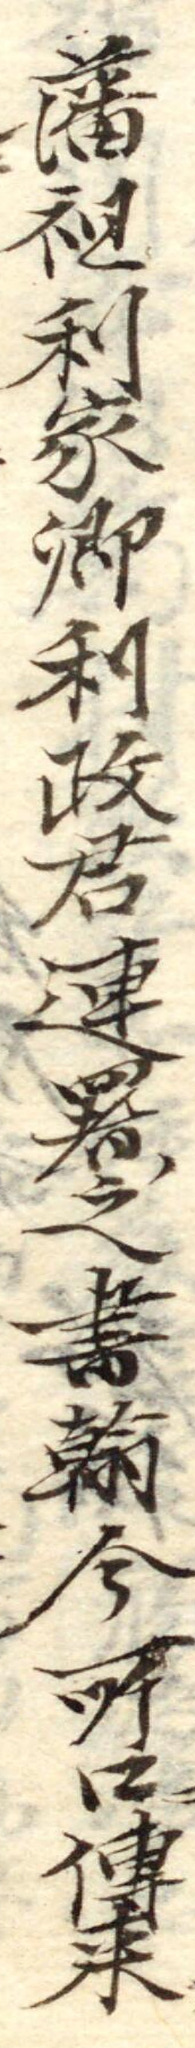藩祖利家卿利政君連署之書翰今所口に伝来す
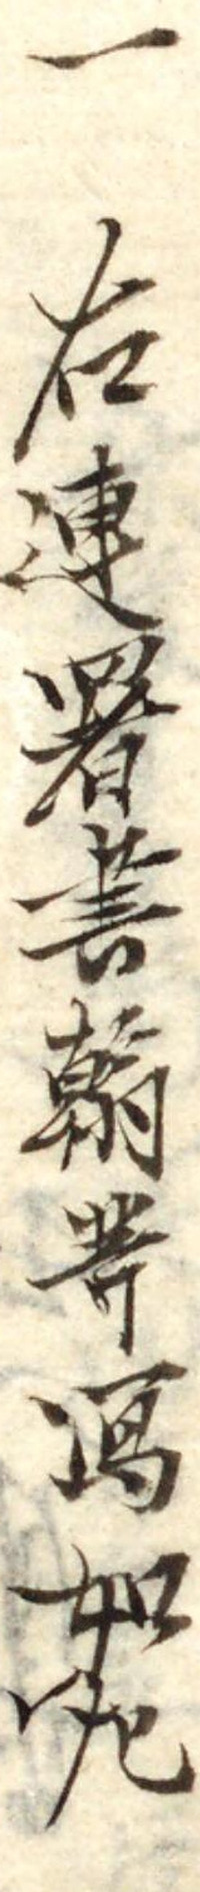一右連署書翰等写如左
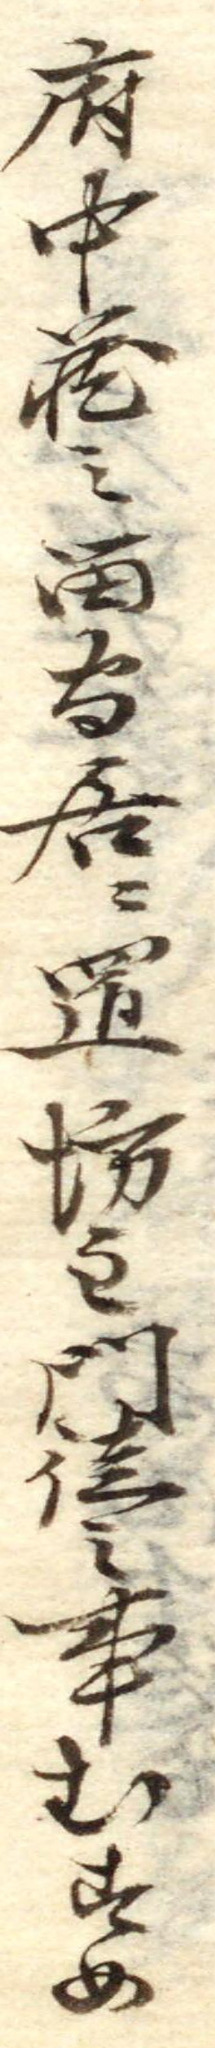府中蔵之留守居に置坊主門徒之事む春め
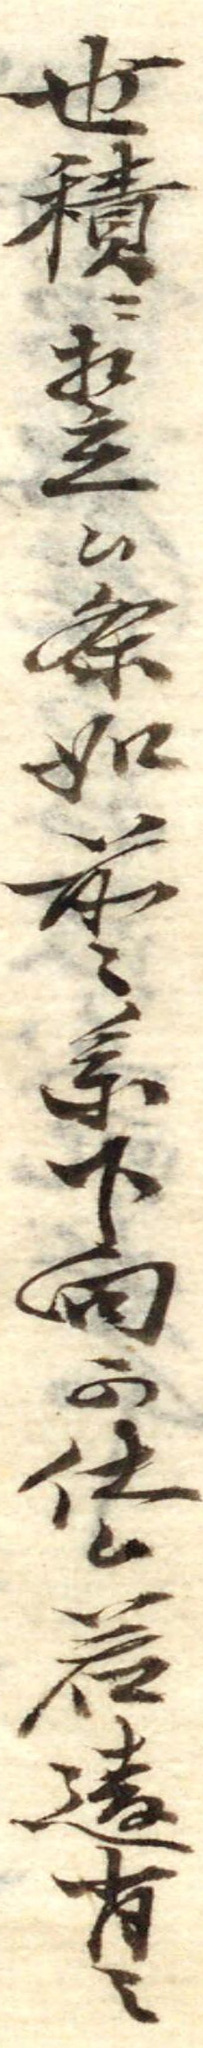世積に相立候条如前々参下向可仕候若違有之
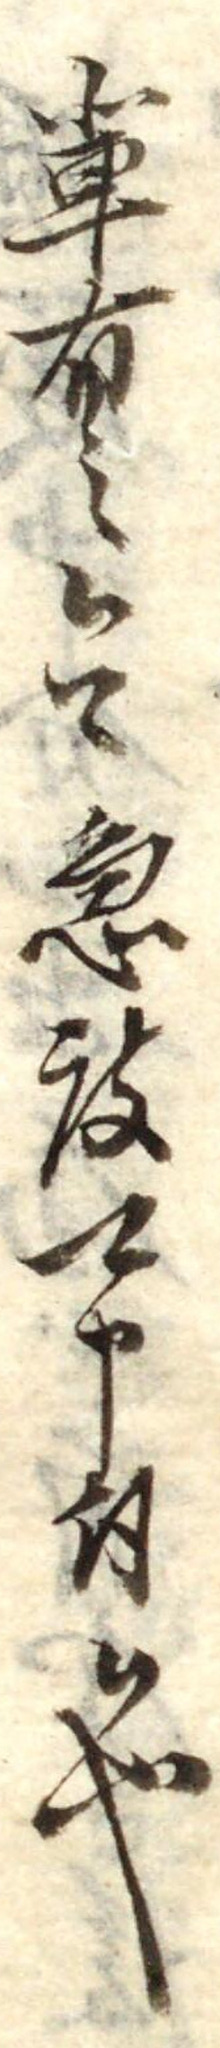輩有之候て急度可申付候也
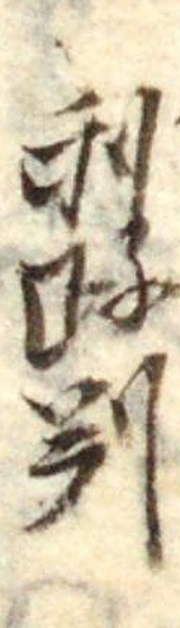利政判
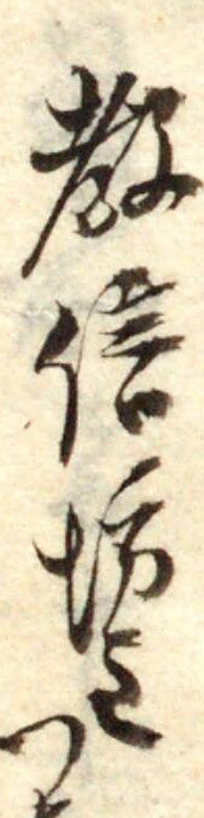教信坊主

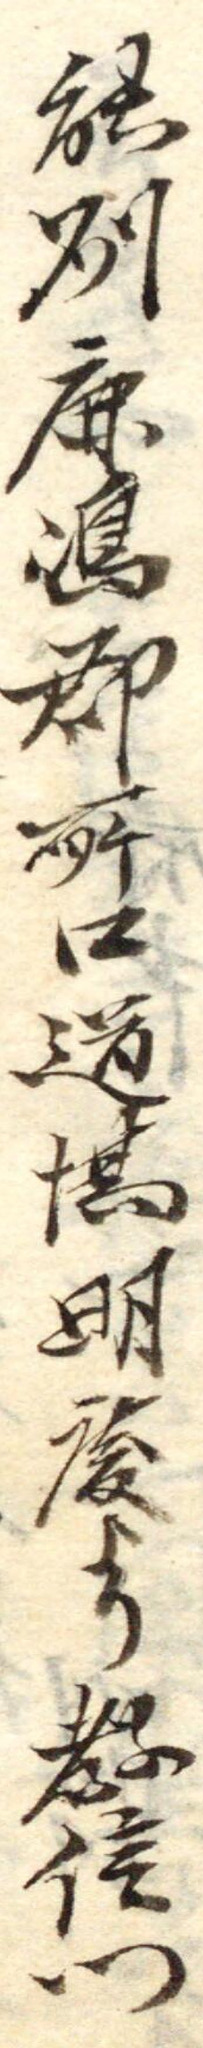能州鹿島郡所口道場明慶より教信門
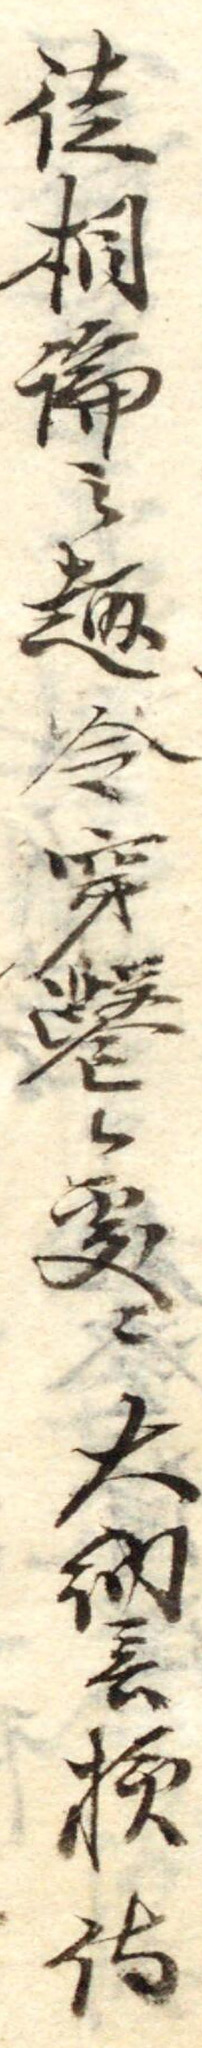徒相論之趣令穿鑿候處に大納言様侍
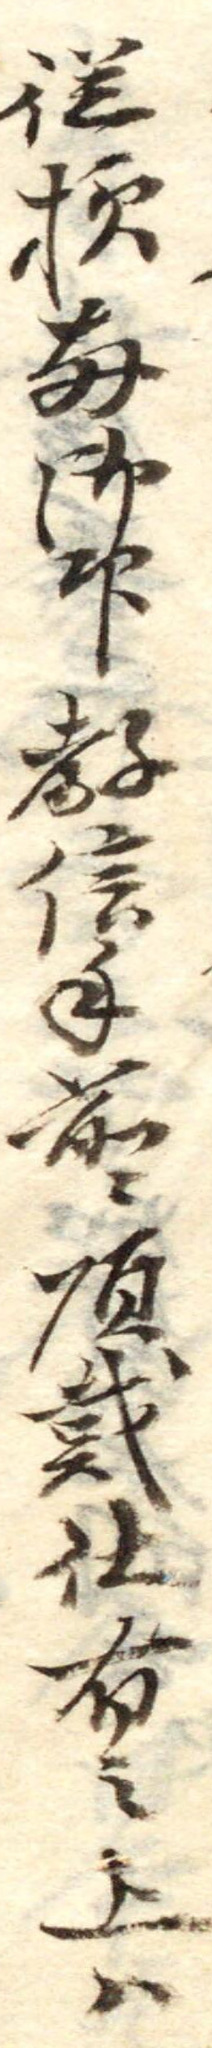従様両御印教信手前に頂戴仕有之上は
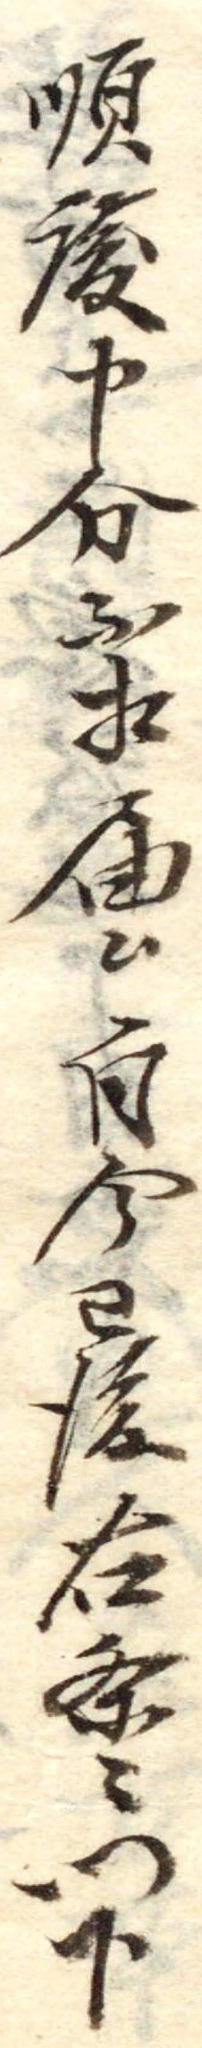順慶申分ふ相届候自今已後右条に門下
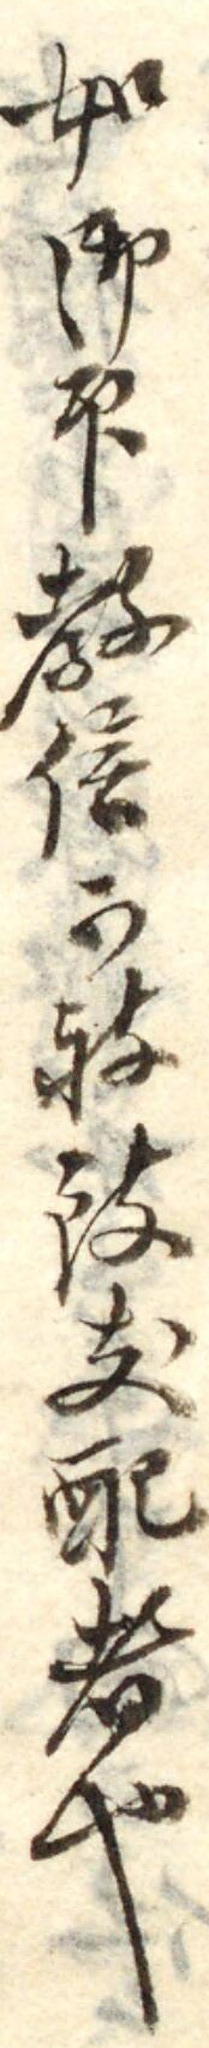如御印教信可被致支配者也
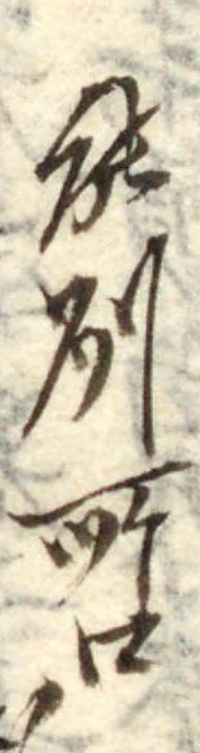能州所口
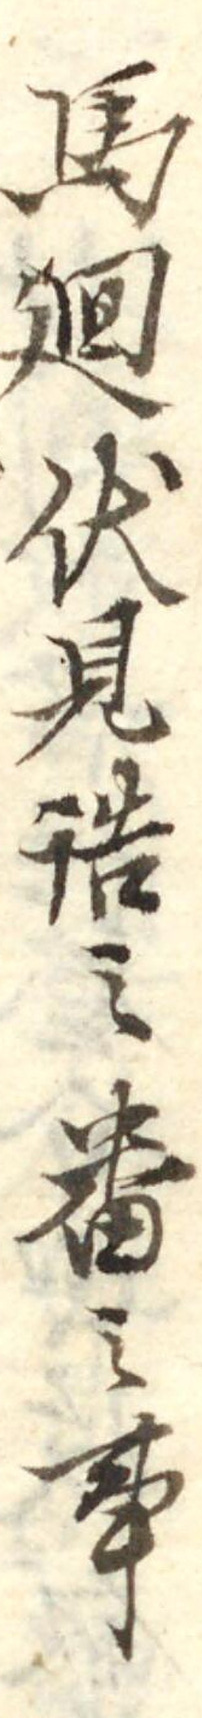馬廻伏見詰之番之事
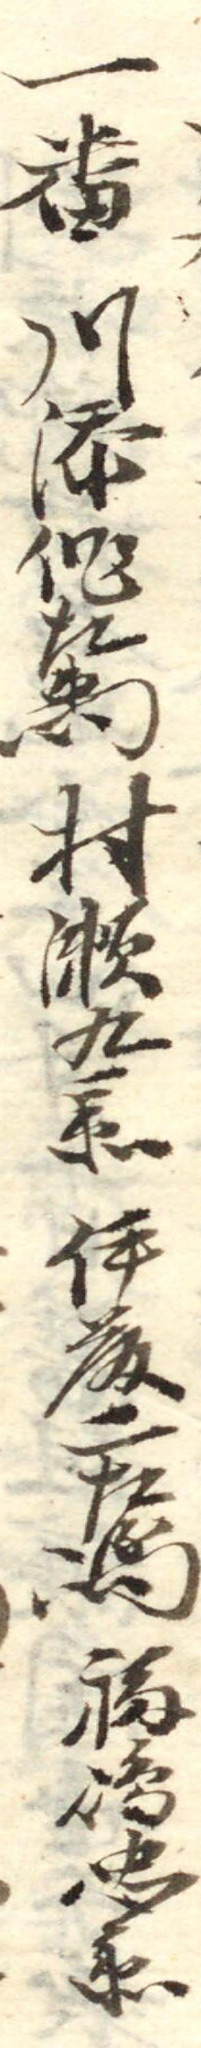一番川添伝左衛門村瀬九兵衛伊藤二左衛門福島忠兵衛
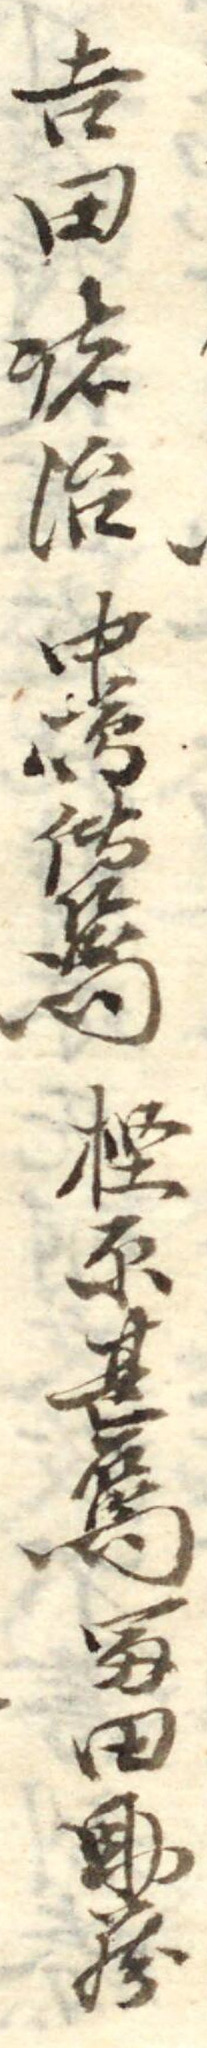吉田諸治中島伝左衛門樫原甚右衛門冨田助蔵
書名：前田家封国証書集録
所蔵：Ishikawa Prefectural Library
